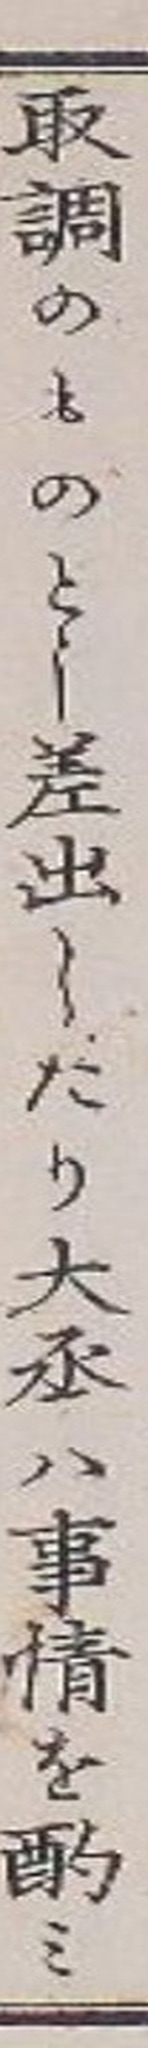取調のものとし差出したり大丞は事情を酌み
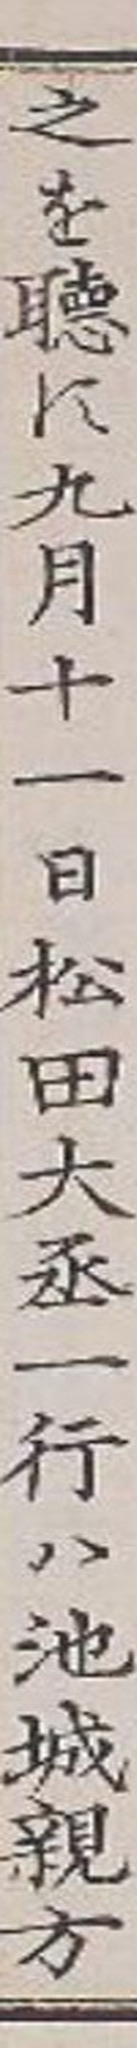之を聴す九月十一日松田大丞一行は池城親方
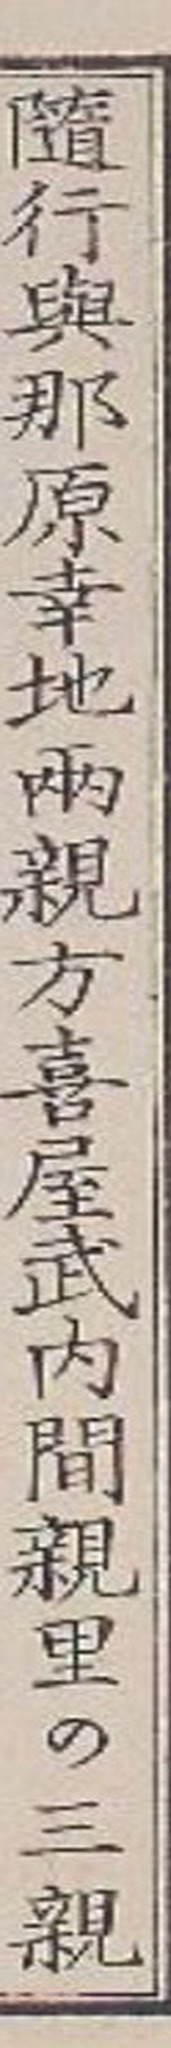随行与那原幸地両親方喜屋武内間親里の三親
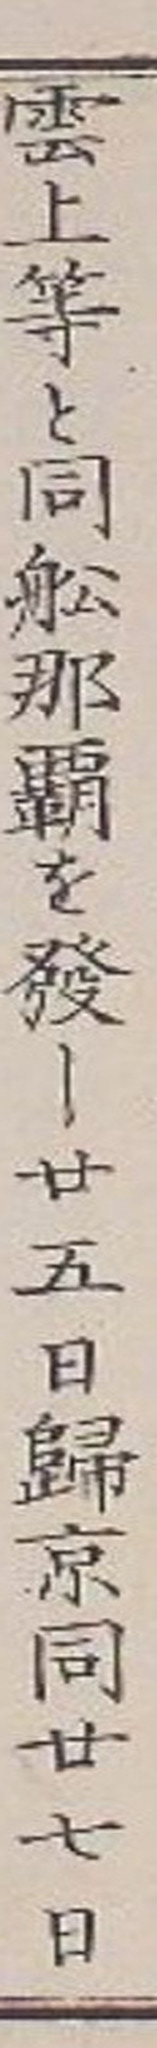雲上等と同船那覇を発し廿五日帰京同廿七日
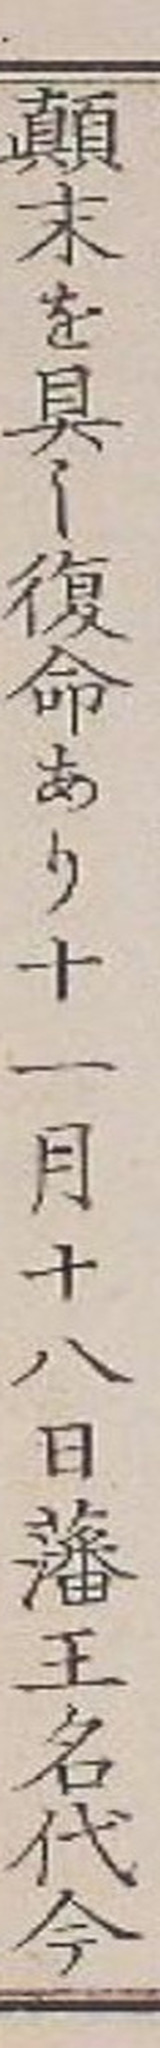顛末を具し復命あり十一月十八日藩王名代今
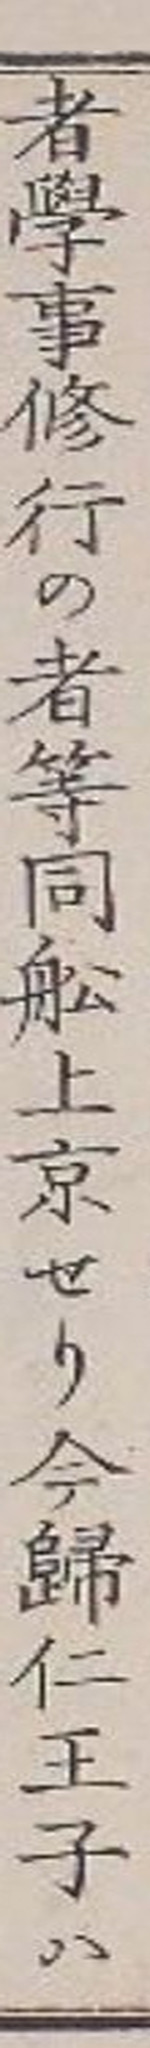者学事修行の者等同船上京せり今帰仁王子は
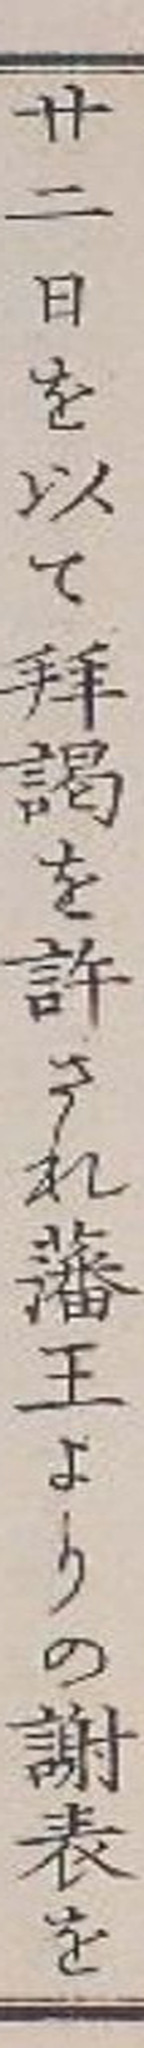廿二日を以て拝謁を許され藩王よりの謝表を
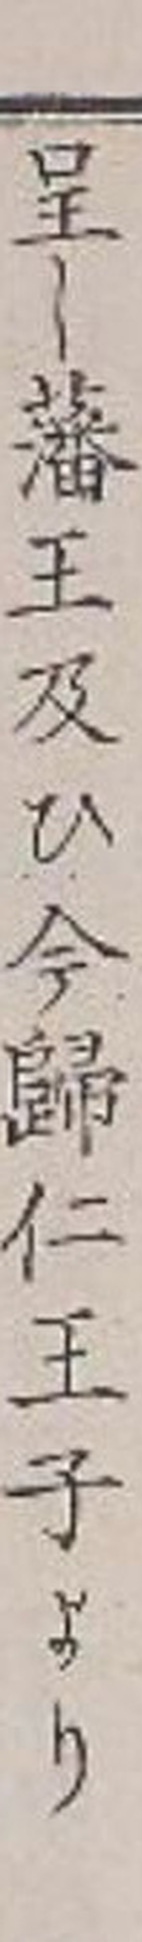呈し藩王及ひ今帰仁王子より
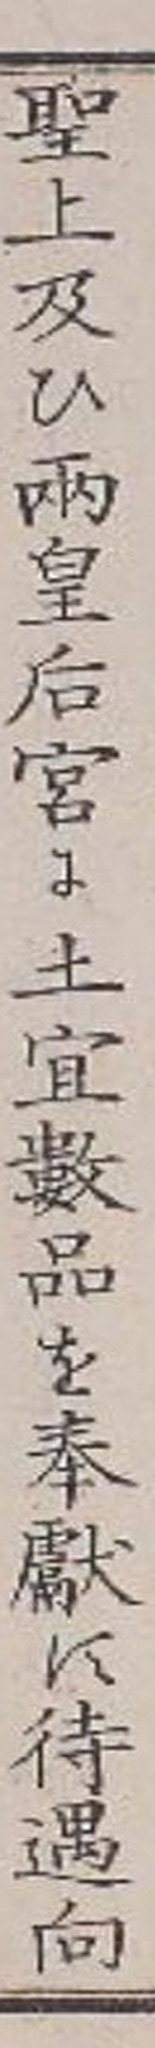聖上及ひ両皇后宮に土宜崇品を奉献す待遇向
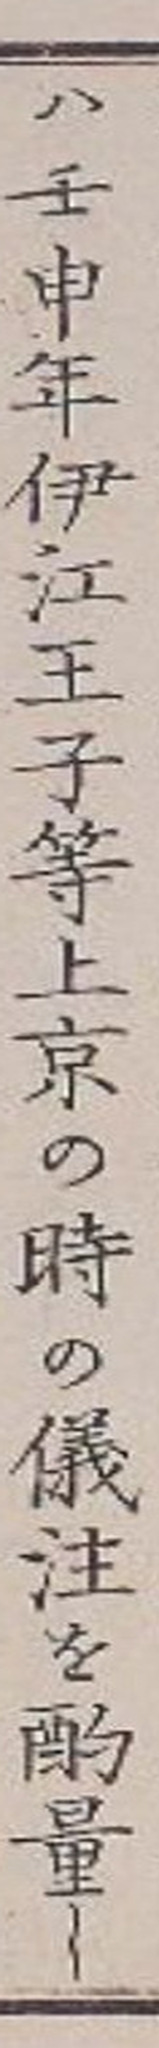は壬申年伊江王子等上京の時の儀注を酌量し
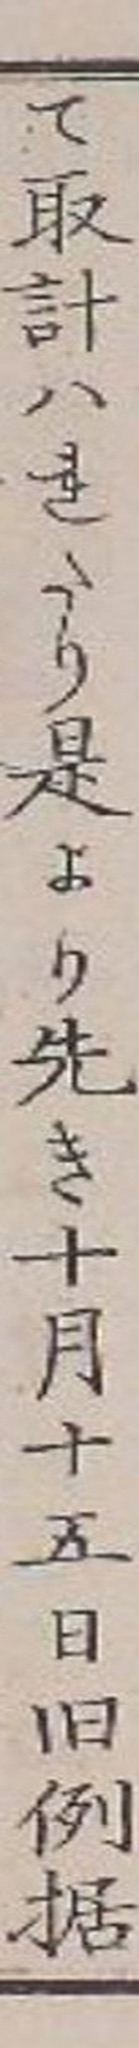て取計はれたり是より先き十月十五日旧例据

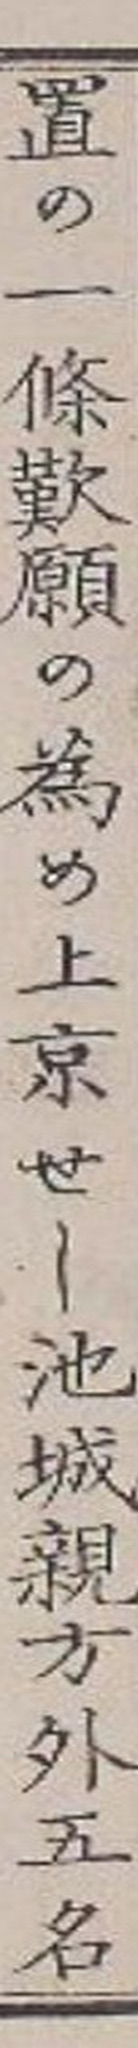置の一条歎願の為め上京せし池城親方外五名
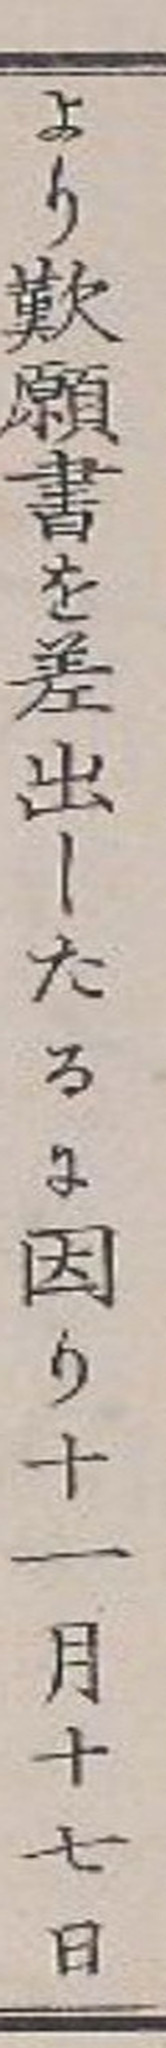より歎願書を差出したるに因り十一月十七日
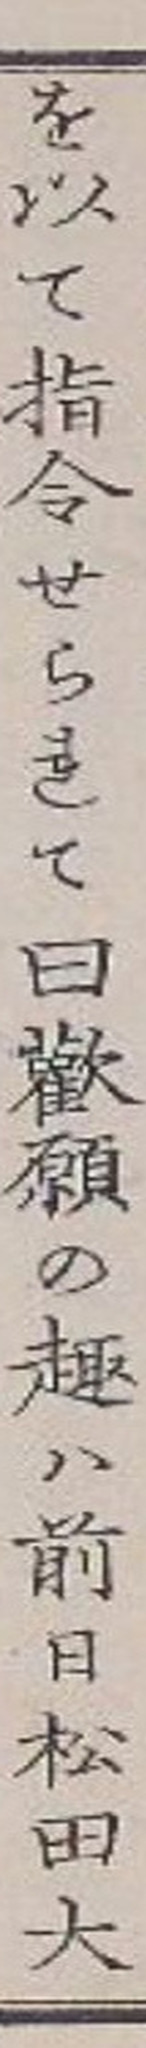を以て指令せられて曰歎願の趣は前日松田大
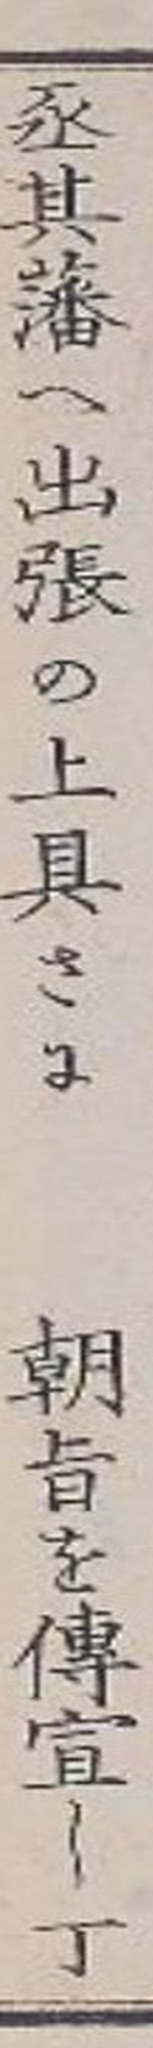丞其藩へ出張の上具さに朝旨を伝宣し丁
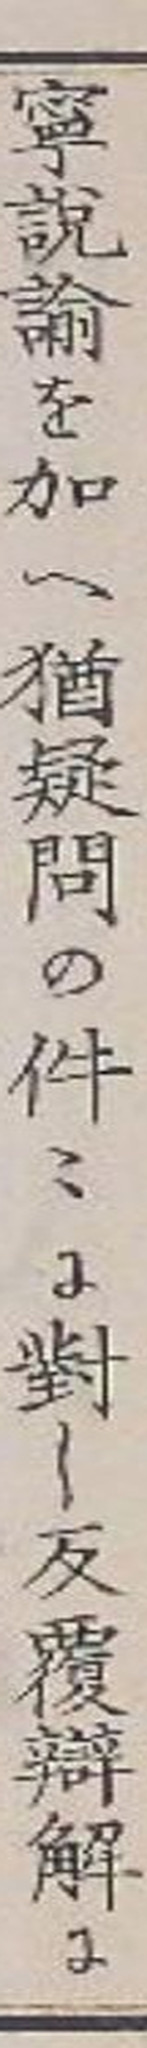寧説諭を加へ猶疑問の件々に封し反覆弁解に
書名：南島紀事 下
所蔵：University of the Ryukyus Library
